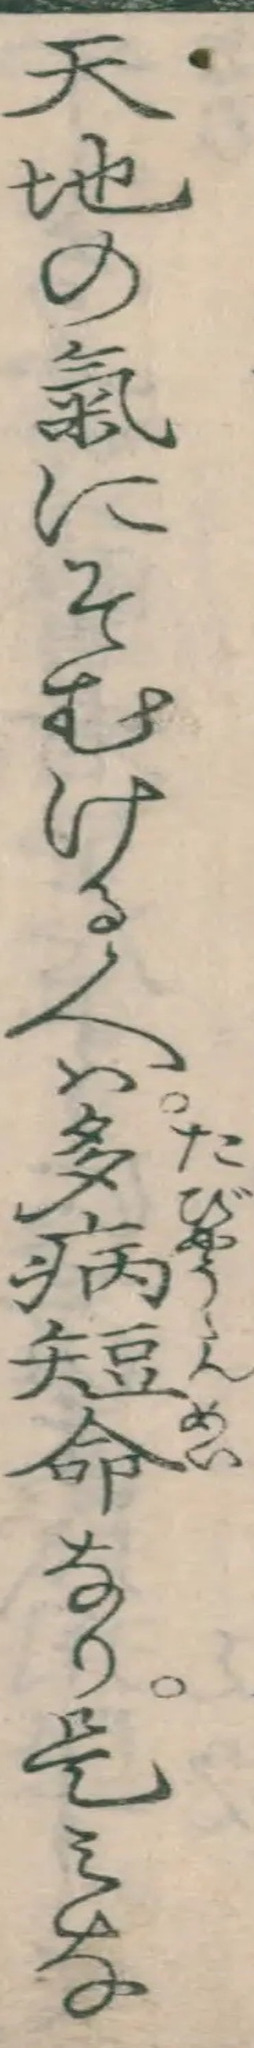天地の氣にそむける人は。多病短命なり。是みな
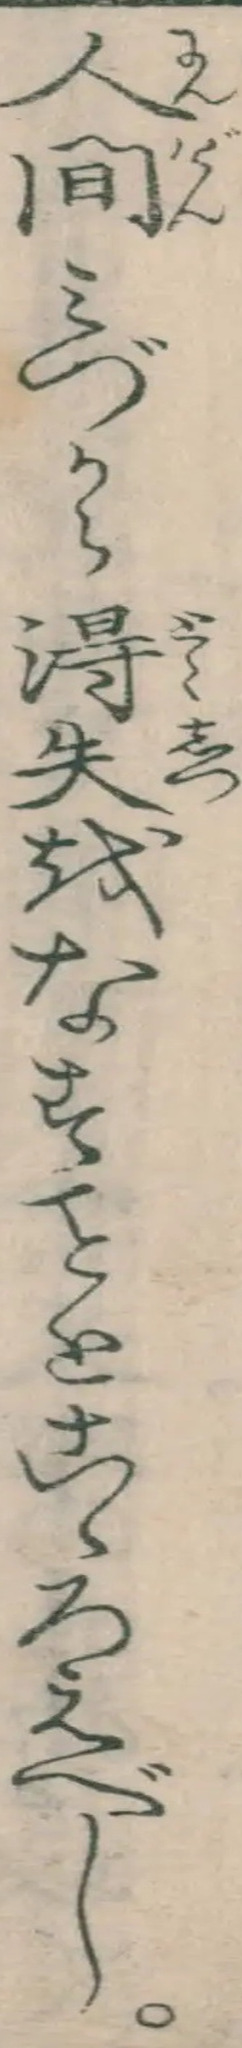人間みづから得失をなすこととこゝろえべし。

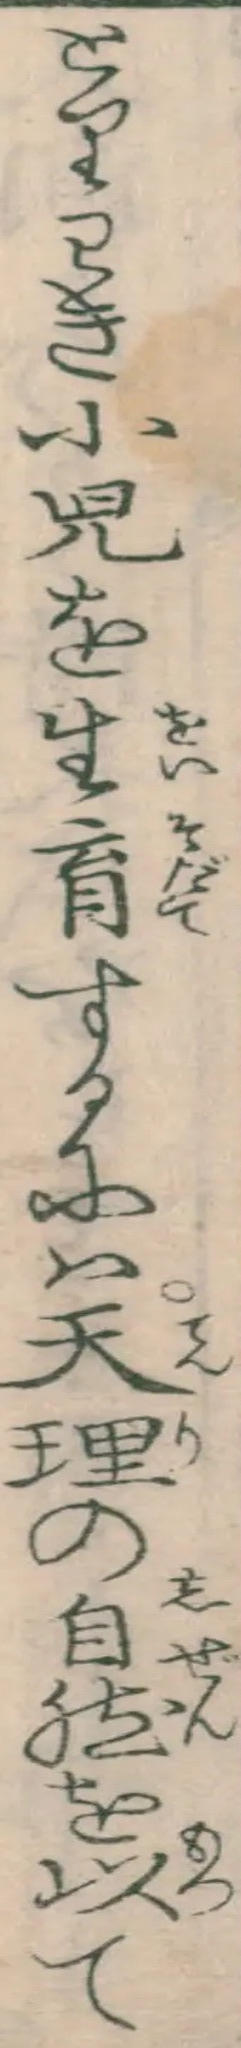とりわき小児を生育するには。天理の自然を以て
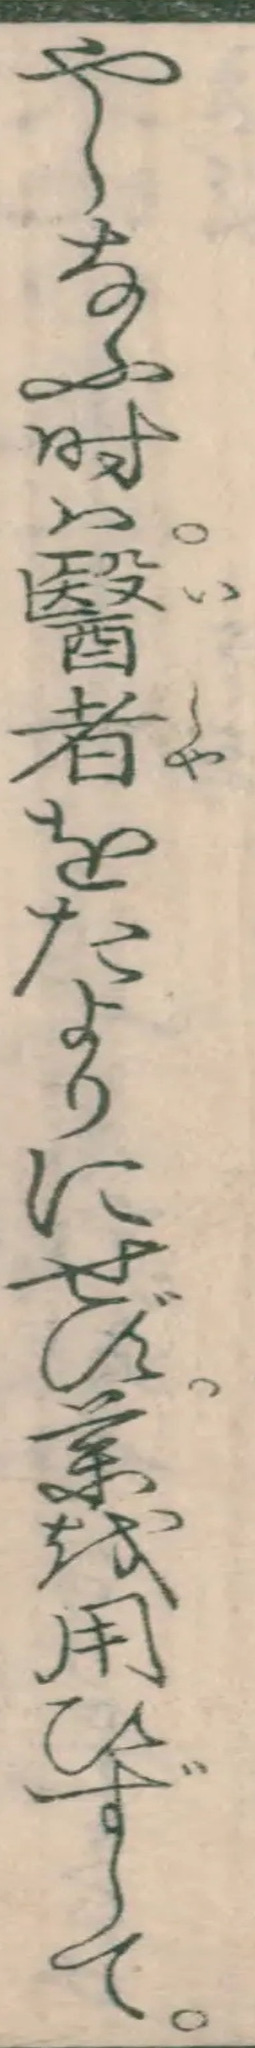やしなふ時は。醫者をたよりにせず。薬を用ひずして。
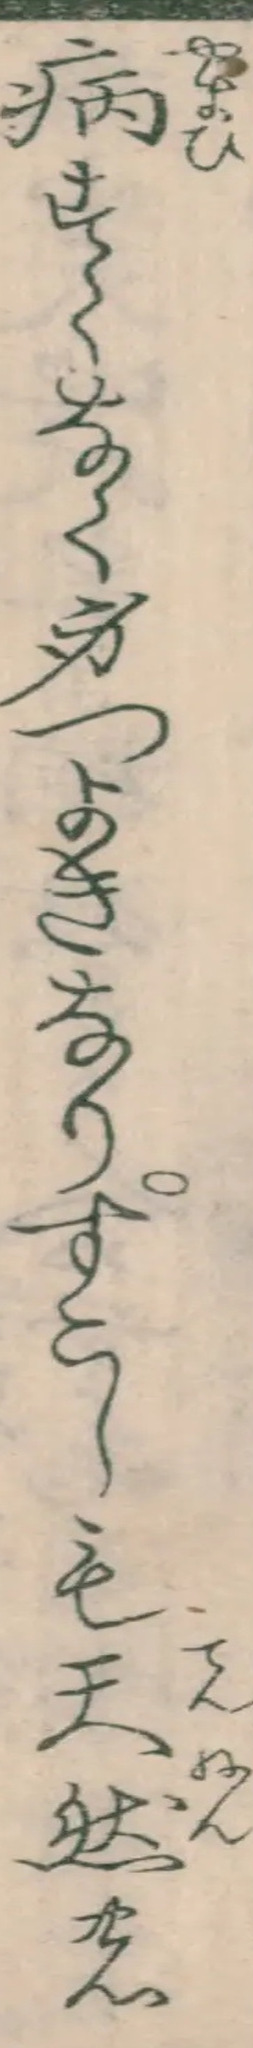病すうなく見つよきなり。すこしも天然の
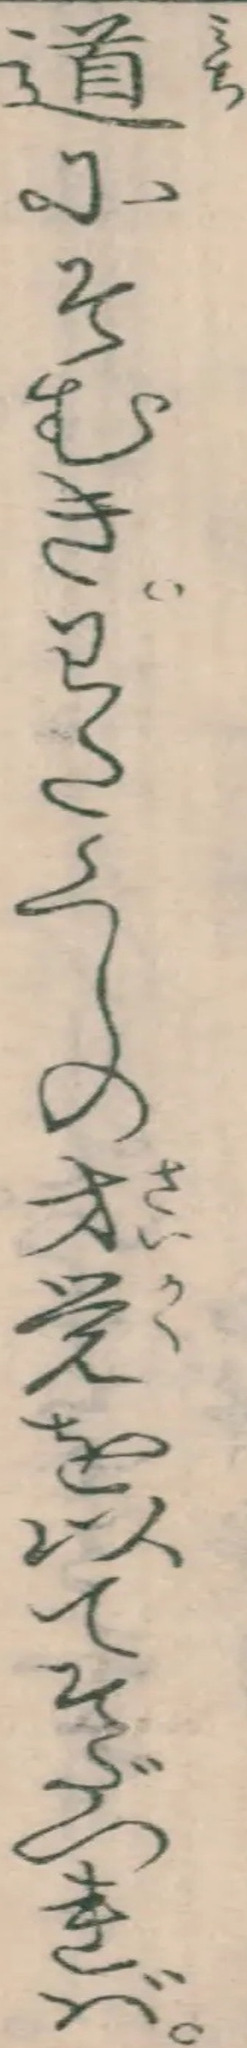道にそむき。わたくしの才覚を以てそだつれば。
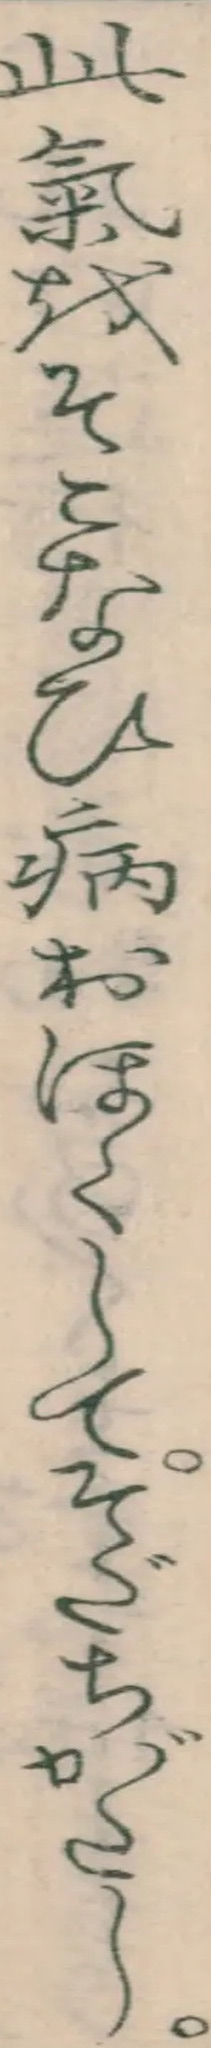此氣をそこなひ病おほくして。そだちがたし。
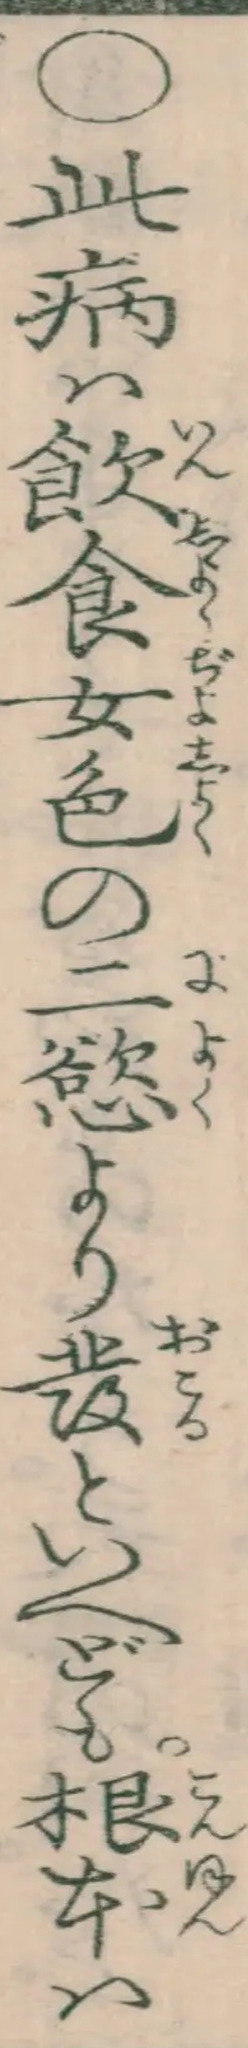〇此病は飲食女色の二慾より發といへども。根本は
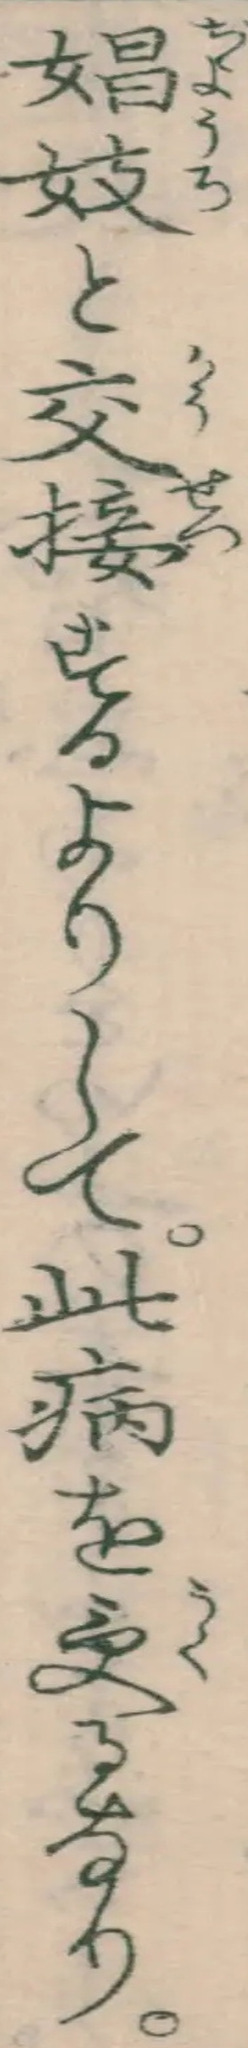娼妓と交接するよりして。此病を受るなり。
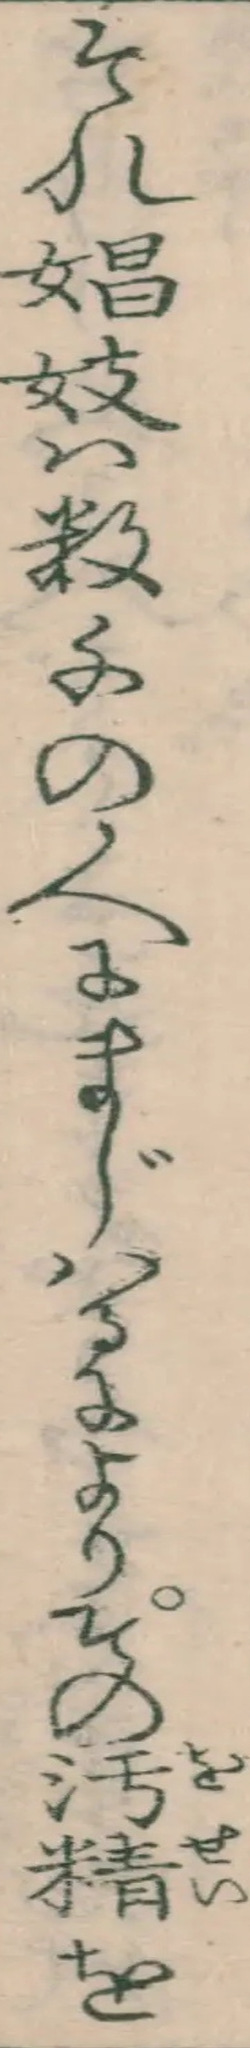それ娼妓は数千の人にまじはるにより。その汚精を
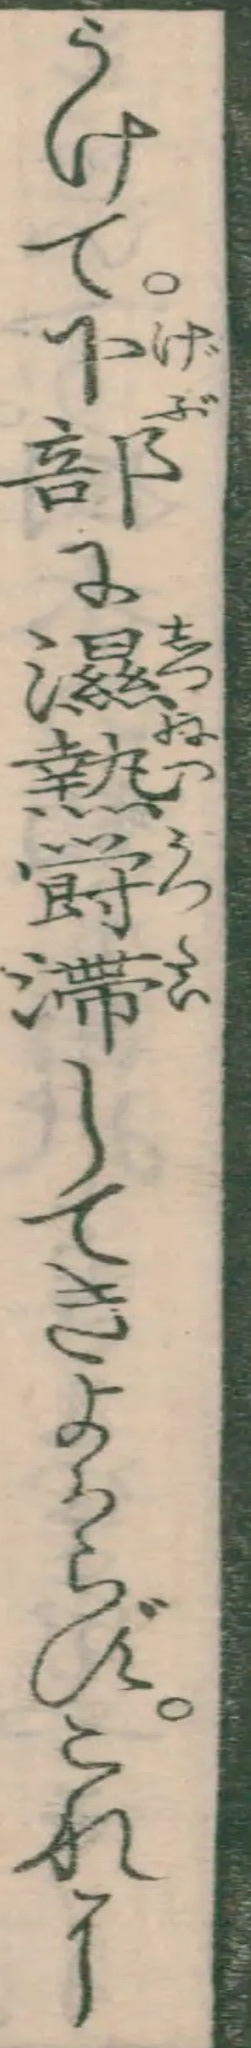うけて。下部に濕熱欝滞してきよからず。これに
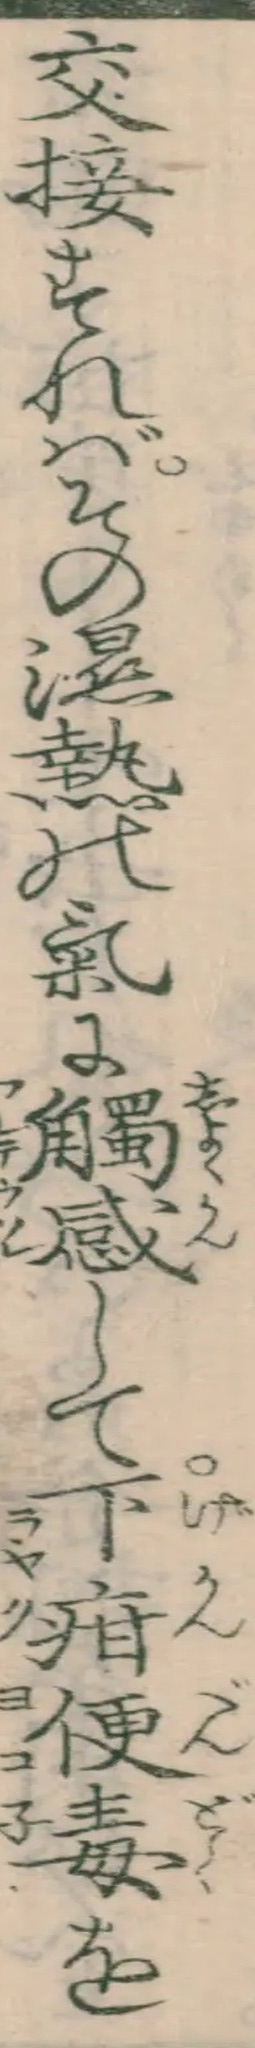交接すれば。その濕熱の氣に觸感して。下疳便毒を
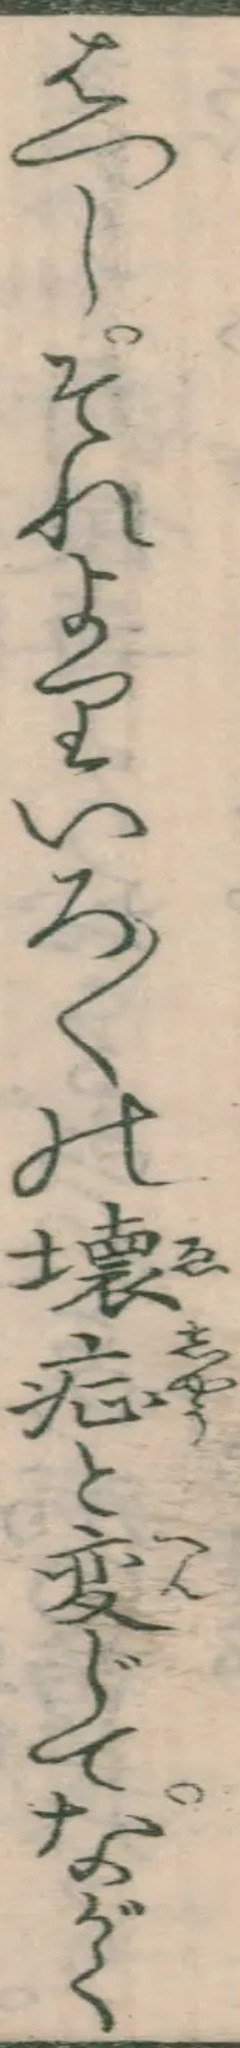はつし。それよりいろ〳〵の壊症と変じて。ながく
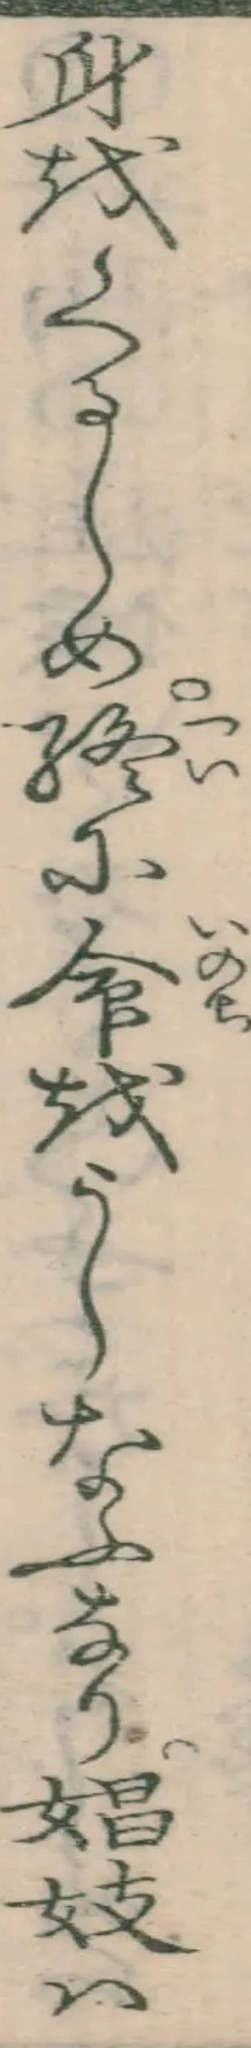身をくるしめ。終に命をうしなふなり。娼妓は
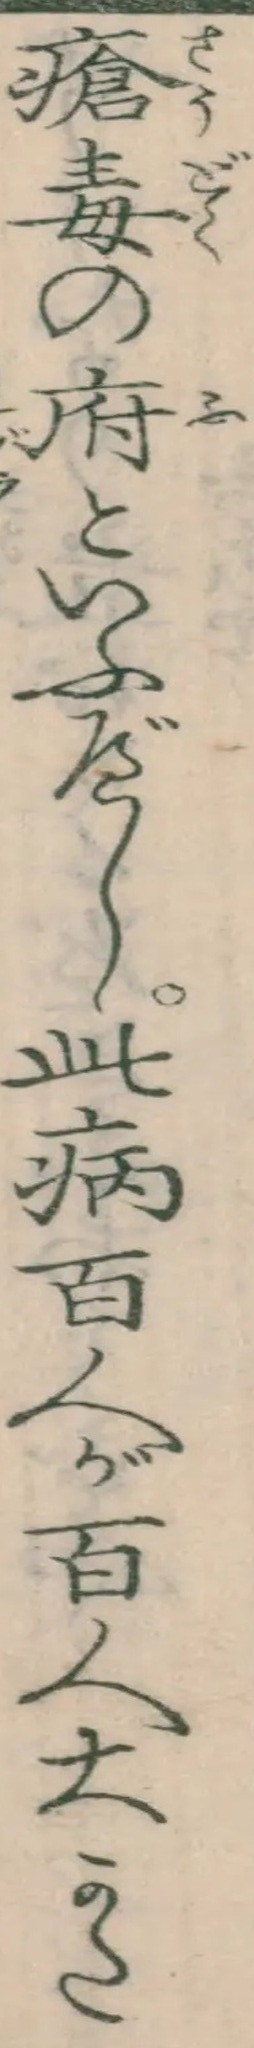瘡毒の府といふべし。此病百人が百人大かた
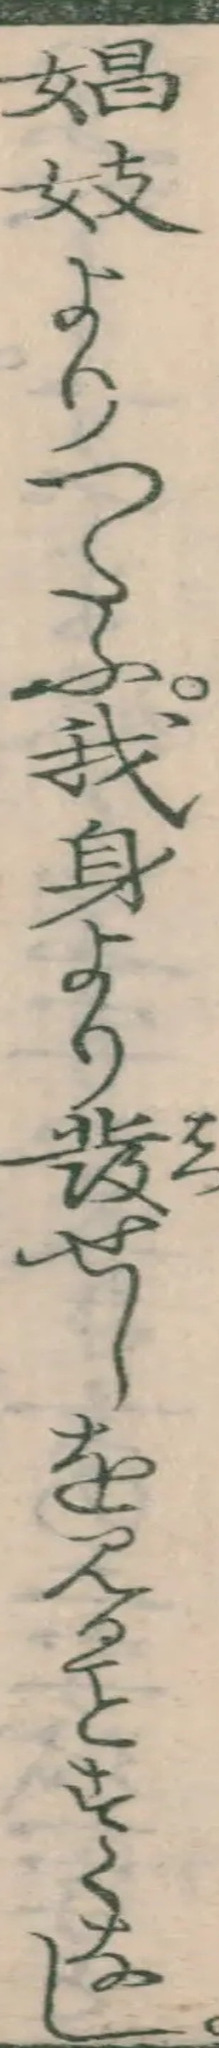娼妓よりつたふ。我身より發せしを見ることすくなし。
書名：瘡家示訓
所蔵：国立国会図書館 National Diet Library, JAPAN
